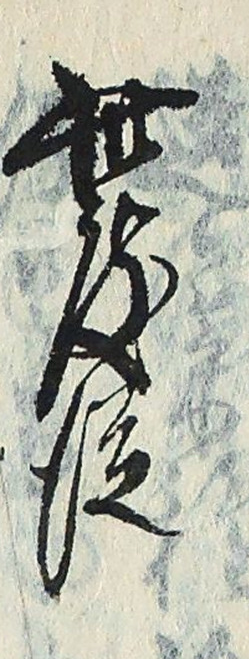此度従
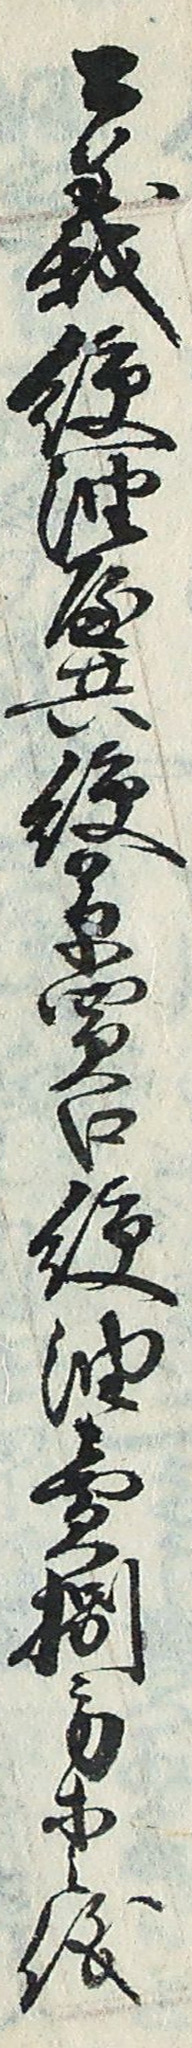公儀絞油屋共絞草買口絞油売捌方等之儀
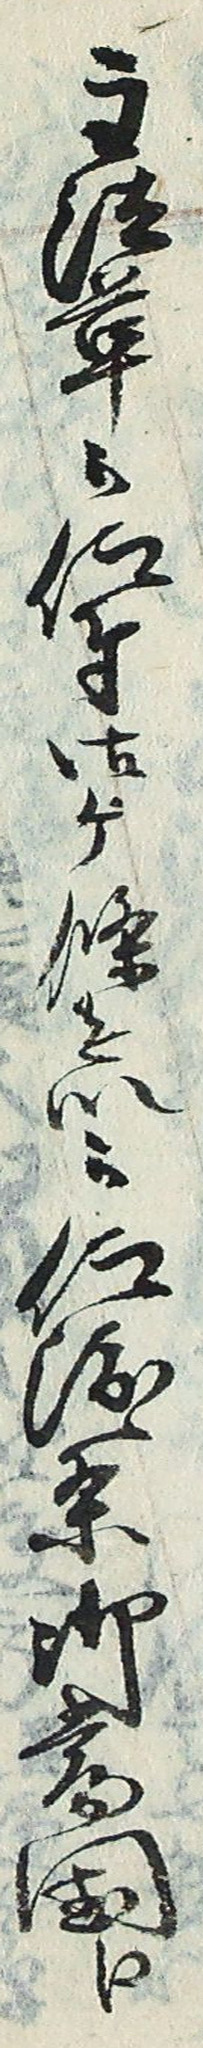主法草被仰付御ケ条を以被仰渡候条御當国江
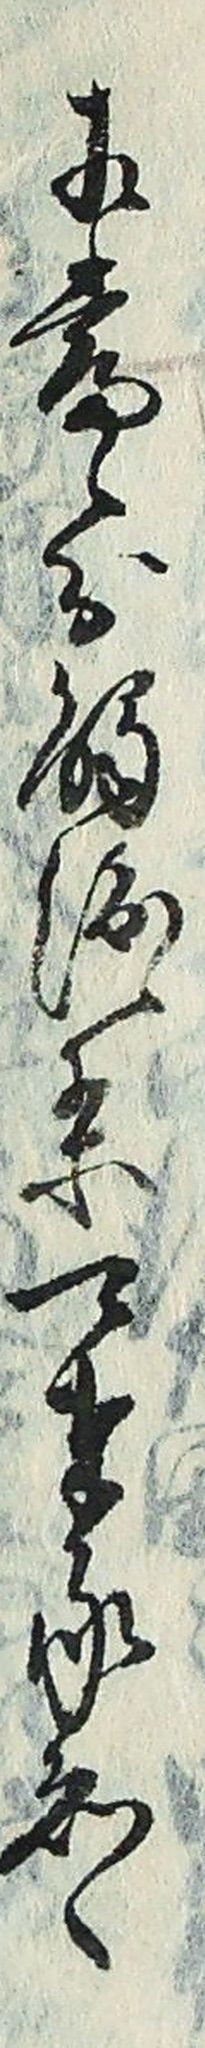相當候分触渡候条可奉承知候
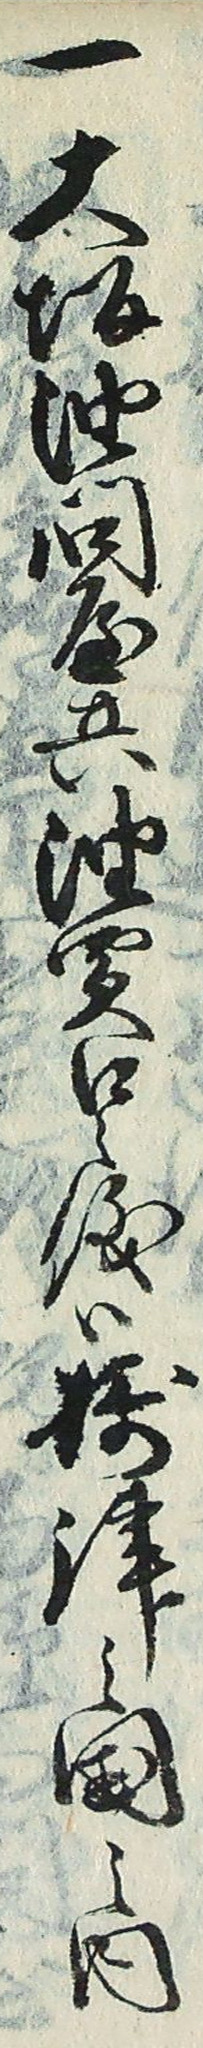一大坂油問屋共油買口之儀は摂津之国之内
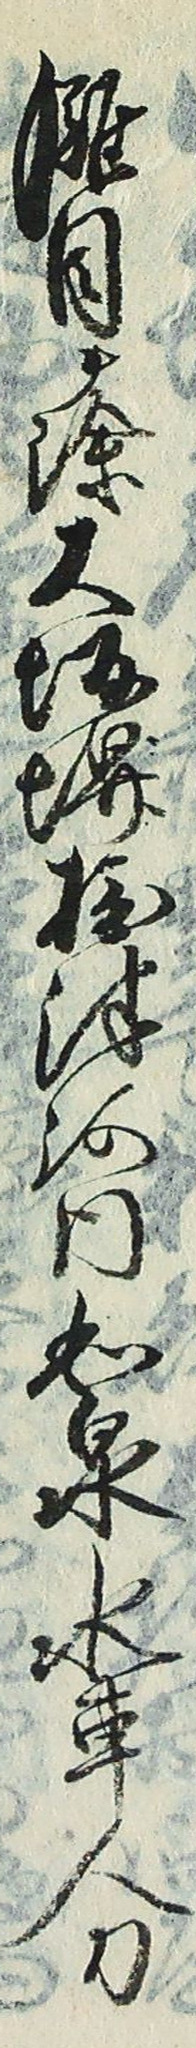灘目を除大坂堺摂津河内和泉水車人力
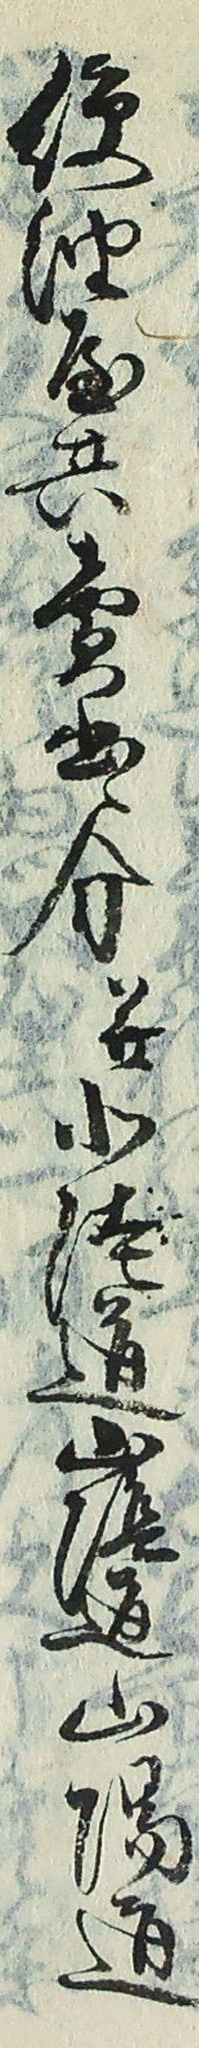絞油屋共賣出候分幷北陸道山陰道山陽道
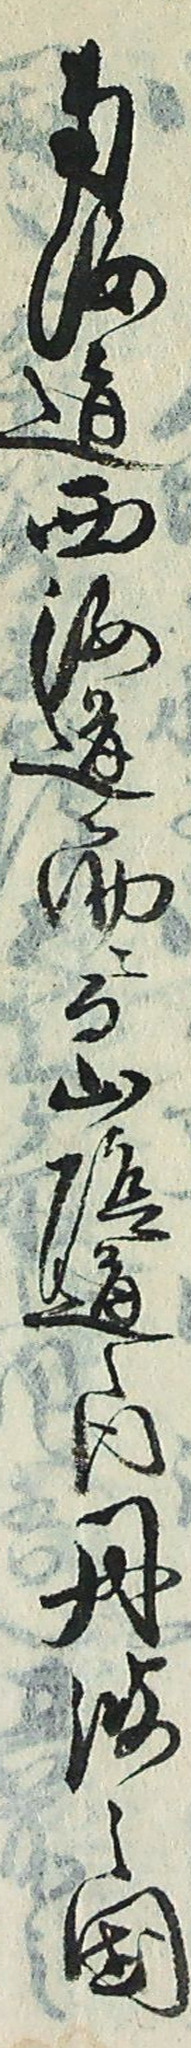南海道西海道筋ニ而山陰道之内丹波之国
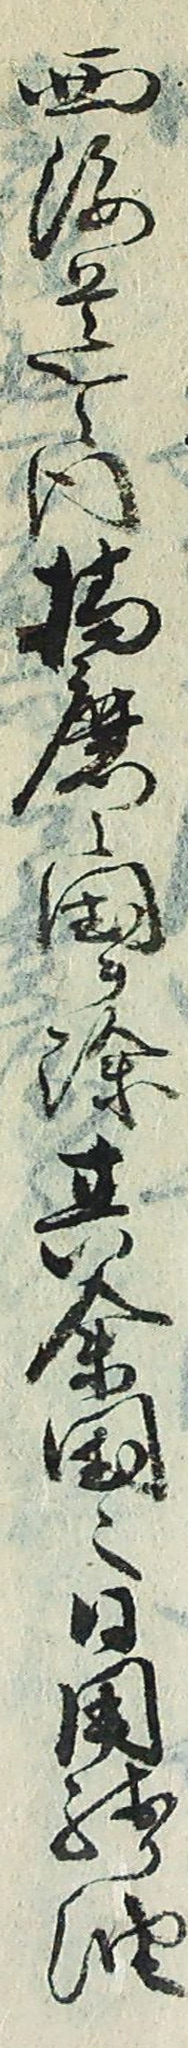西海道之内播磨之国を除其余国々日用残り油
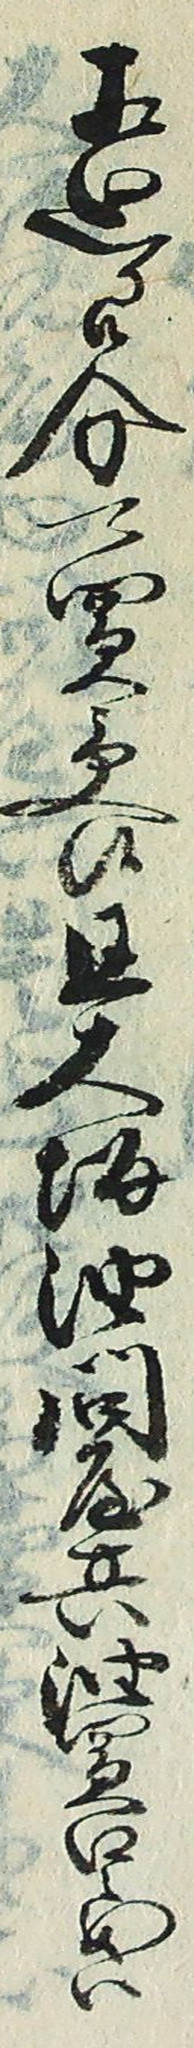相廻り候分可買受候且大坂油問屋共油買口之義は
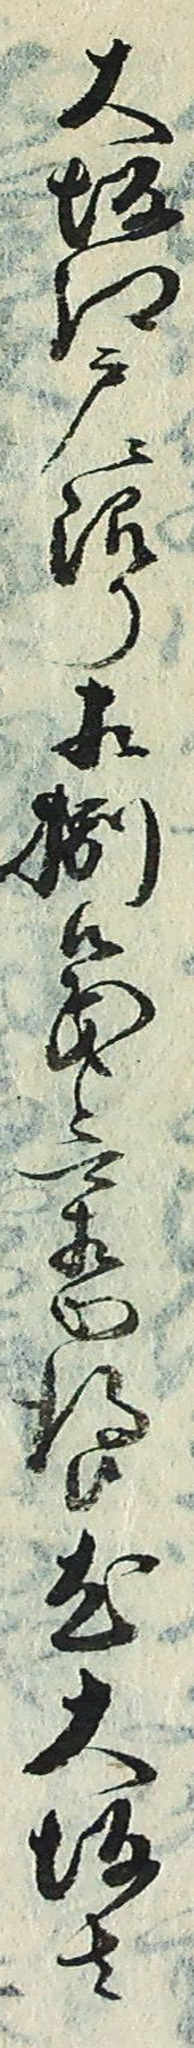大坂江戸に限り相捌候義と可相心得候尤大坂者
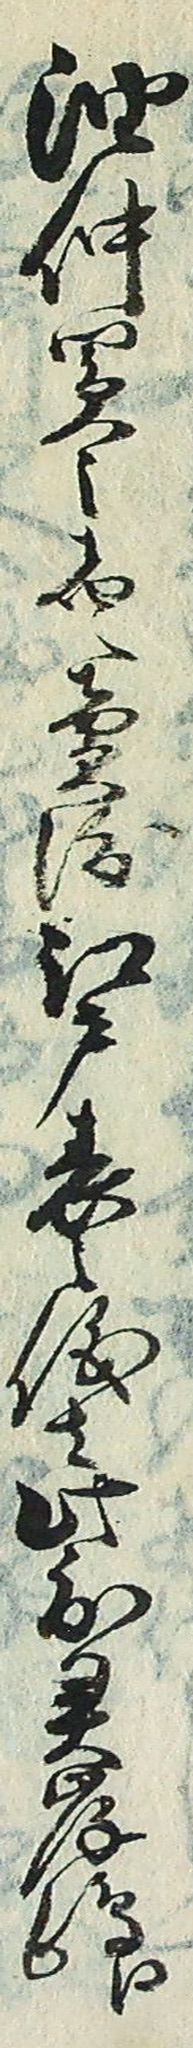油仲買之者へ賣渡江戸表之儀者此度灵岸嶋江
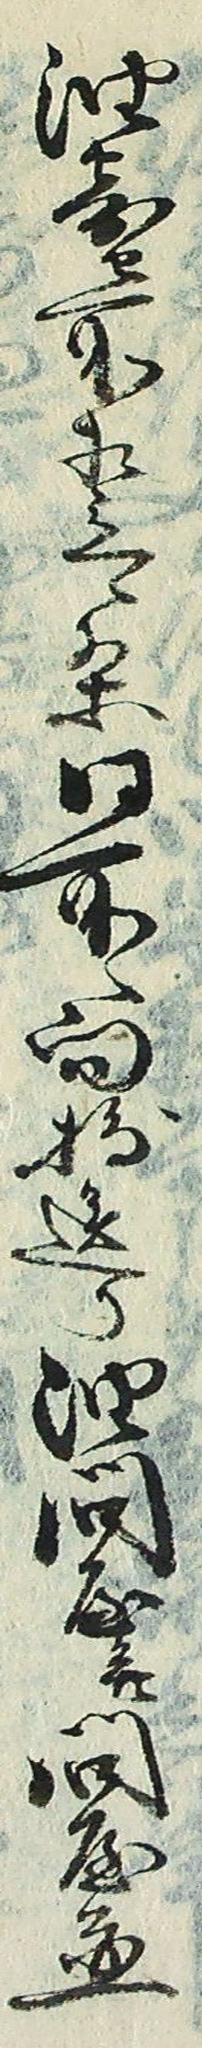油寄せ所相立候条同所へ向指送り油問屋幷問屋並
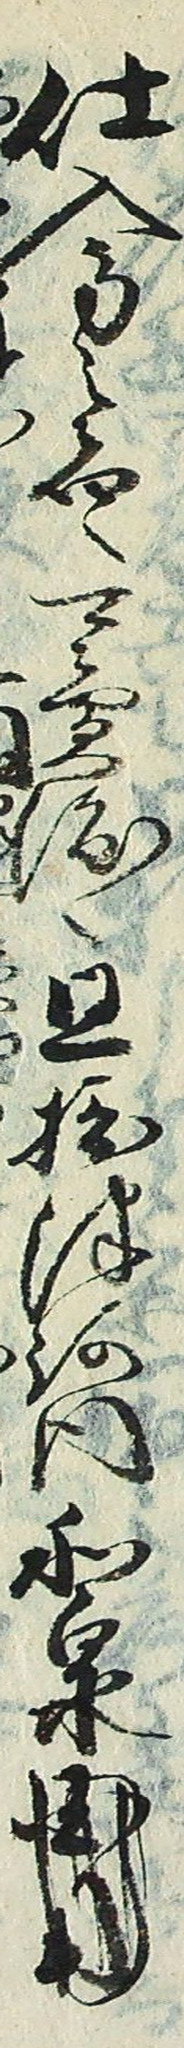仕入方之者へ可賣渡候且摂津河内和泉国用
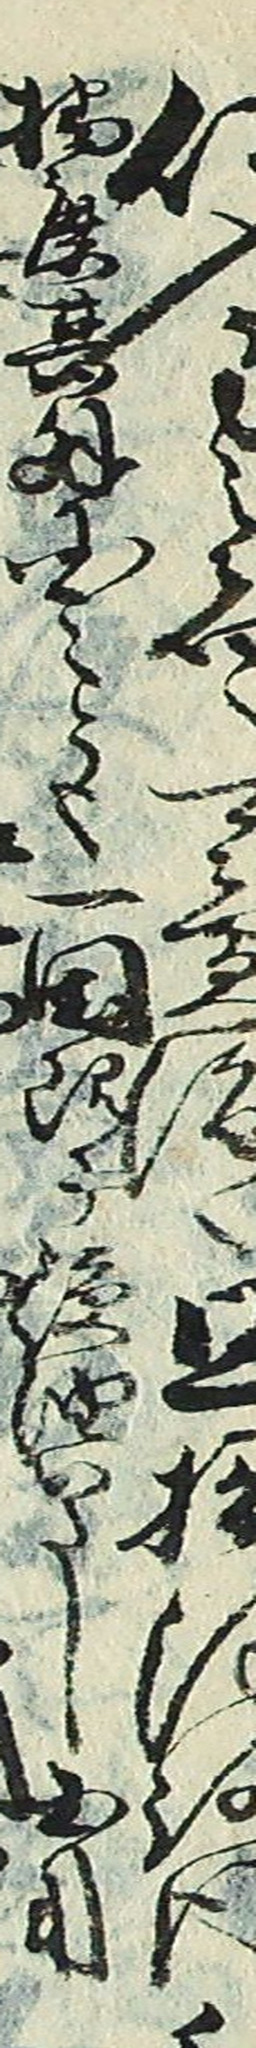播磨其外国々にも一国限り絞油いたし国用
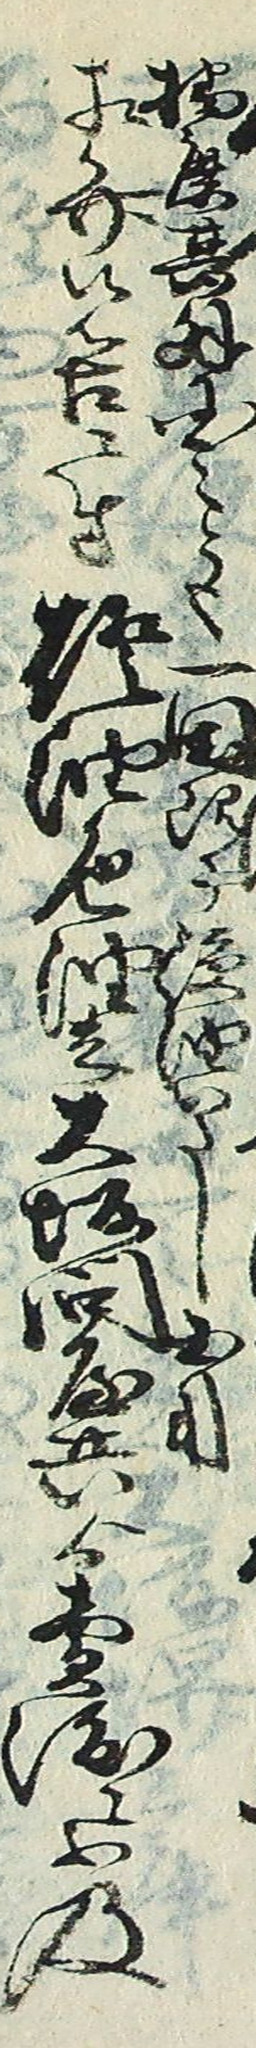相弁候筈に付燈油色油は大坂問屋共ゟ賣渡に不及
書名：油稼御取究ニ附御箇條書テ以被仰渡南北同役申談御答書控
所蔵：鳴門教育大学 Naruto University of Education
